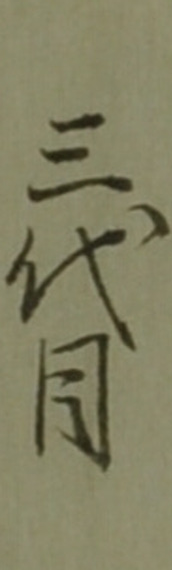三代目
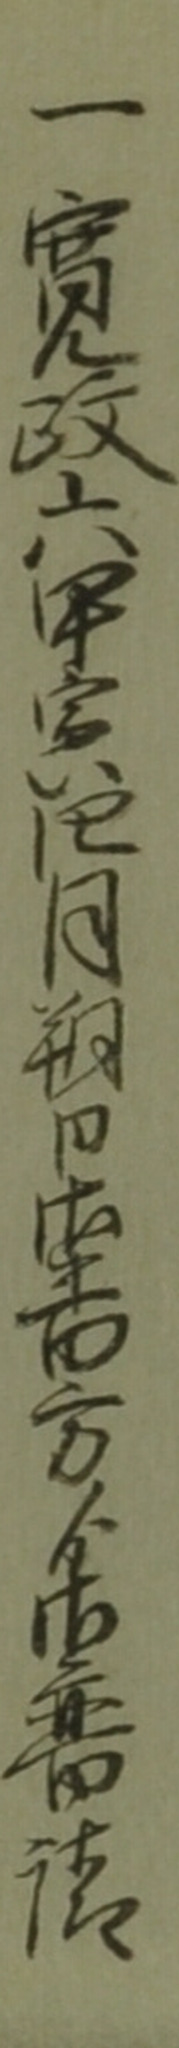一寛政六甲寅四月朔日御番方ゟ御普請
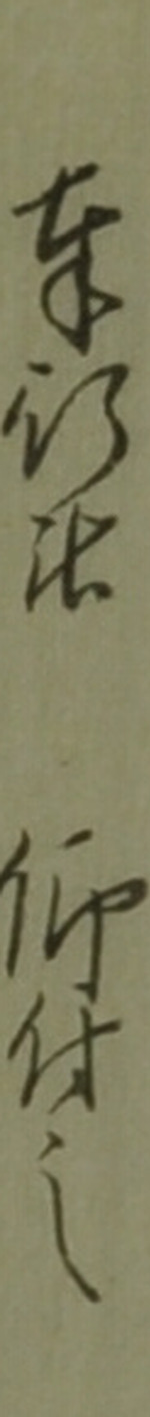奉行被仰付之
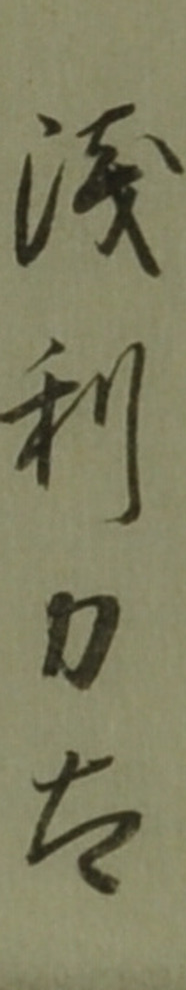浅利力太
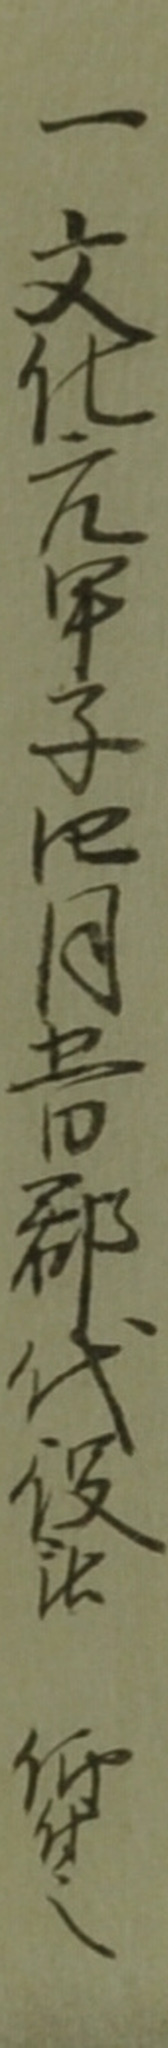一文化元甲子四月十一日郡代役被仰付之
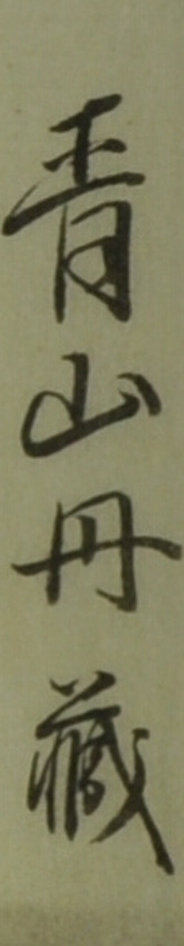青山丹蔵

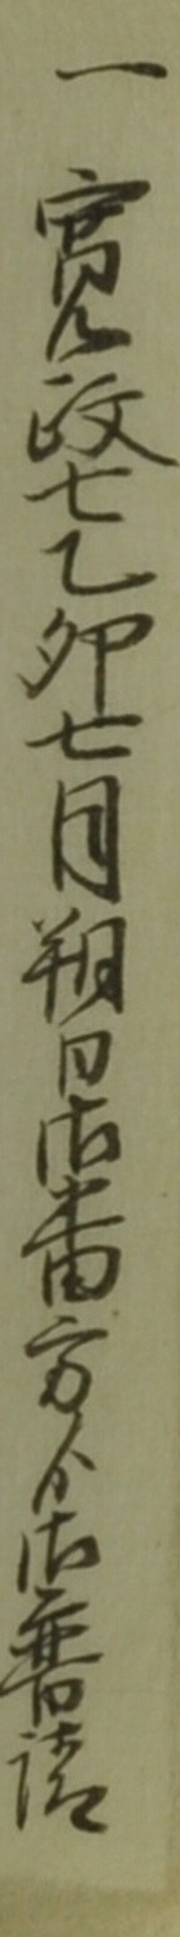一寛政七乙卯七月朔日御番方ゟ御普請
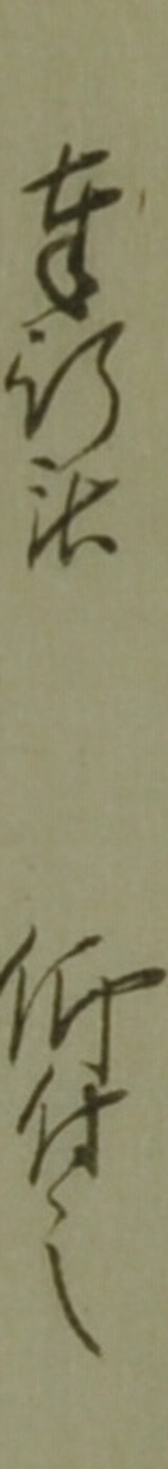奉行被仰付之
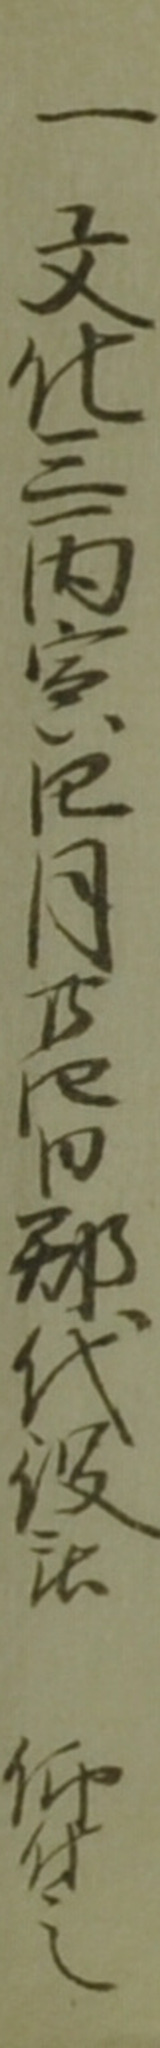一文化三丙寅四月廿四日郡代役被仰付之
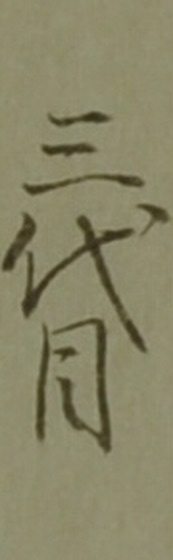三代目
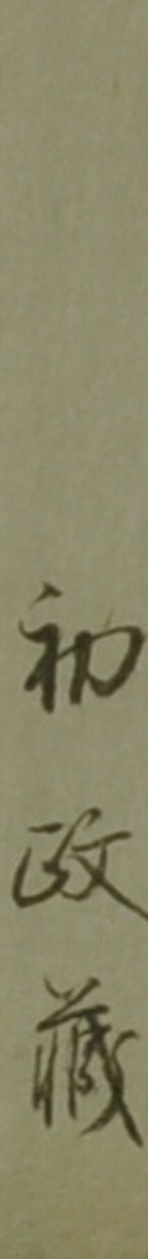初政蔵
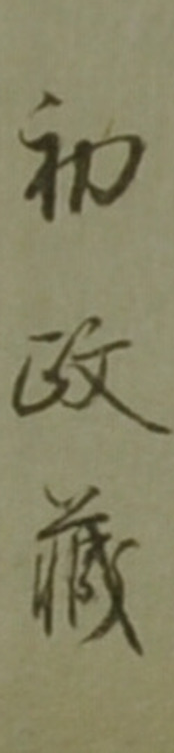初政蔵
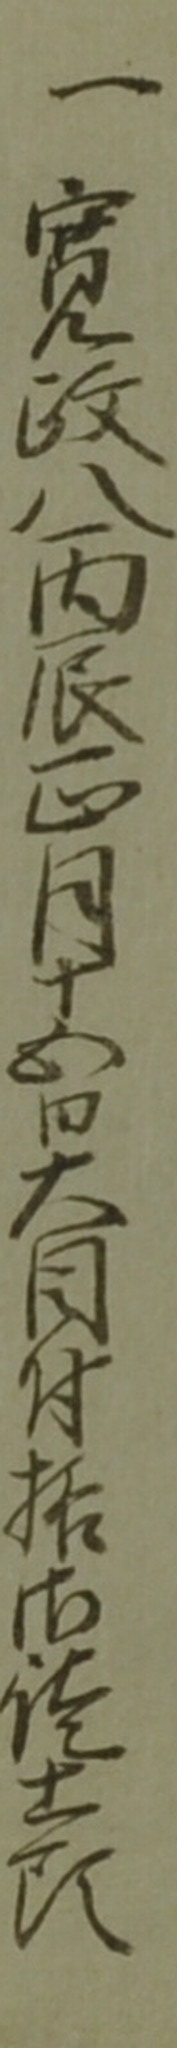一寛政八丙辰正月十五日大目付格御徒士頭
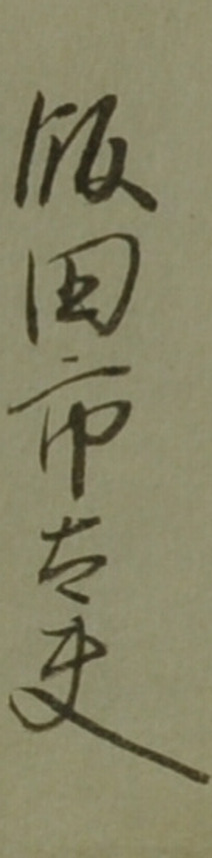飯田市太夫
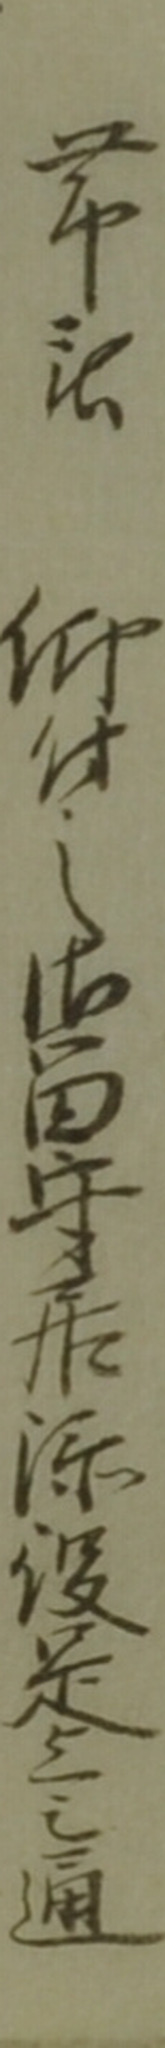帯被仰付之御留守居添役是迄之通
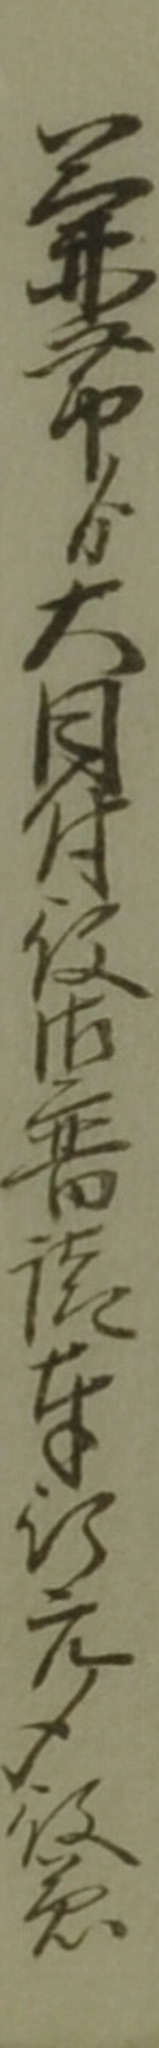兼帯ゟ大目付役御普請奉行元〆役兼
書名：諸御役代々録（六）
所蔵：伊那市立高遠町図書館・合同会社AMANE
